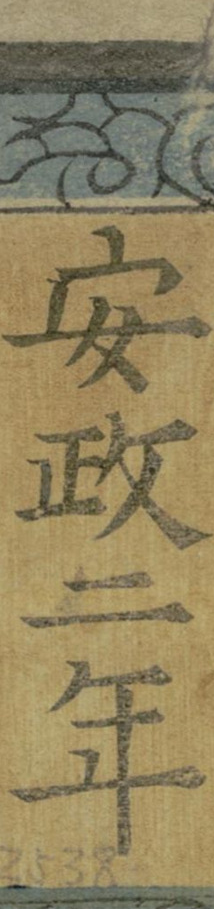安政二年
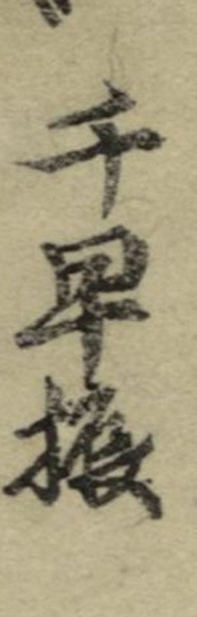千早振
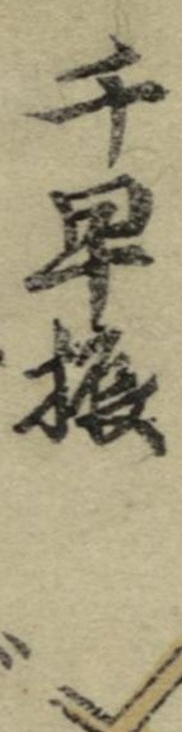千早振
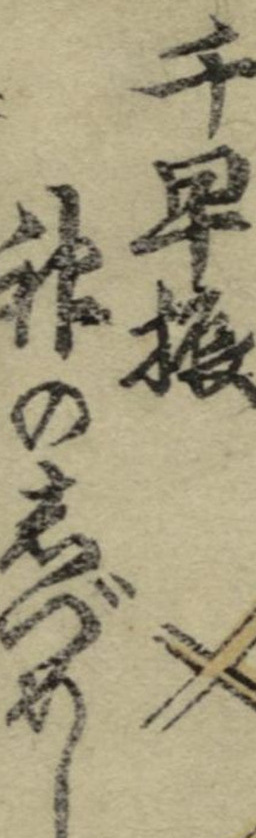神のしづめし
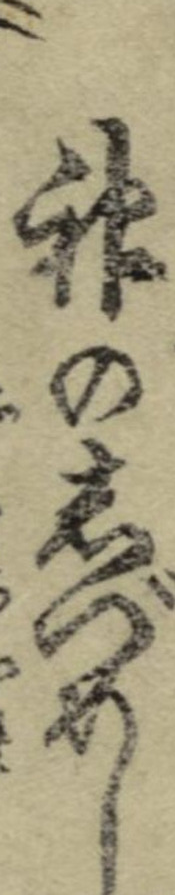神のしづめし
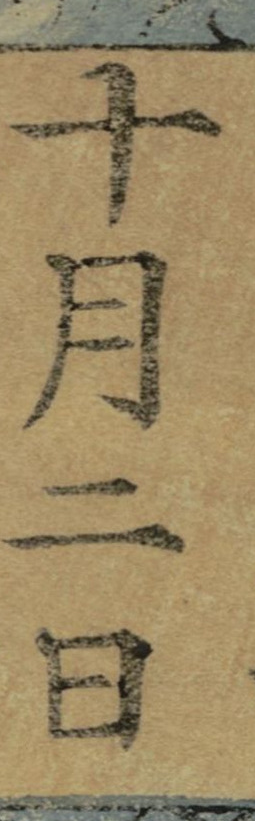十月二日
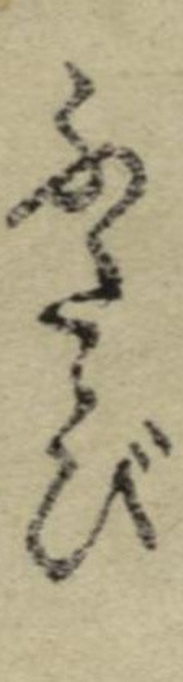ふたゝび
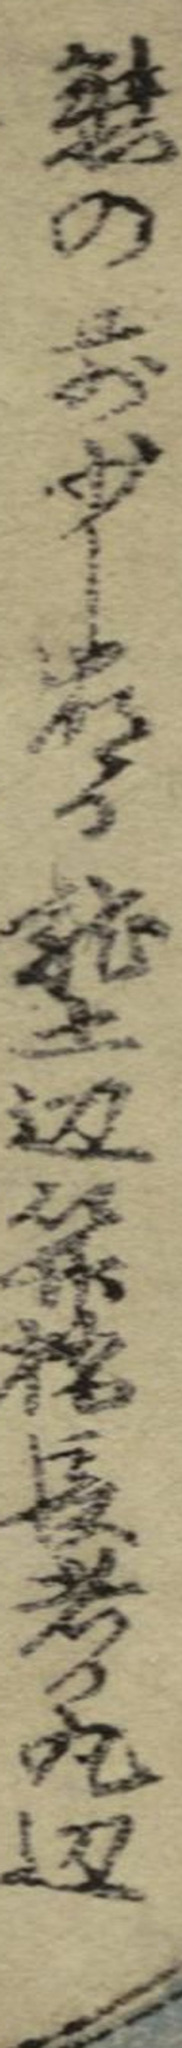鰊？の前少し崩る就土辺笄橋長者か丸辺
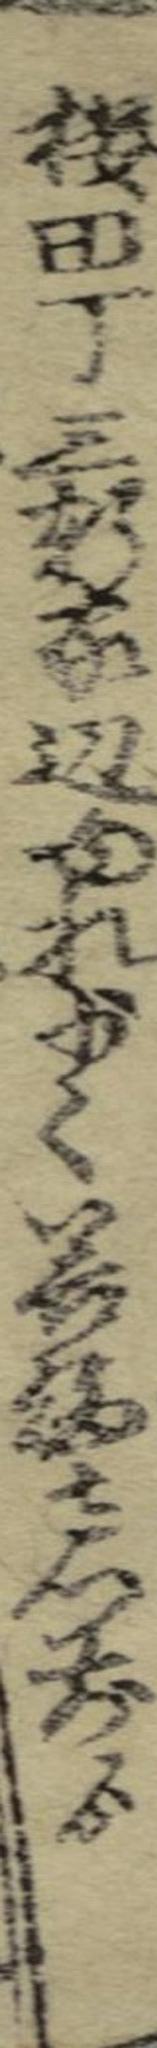桜田町三軒家辺ゆれ少く善福寺門前ゟ
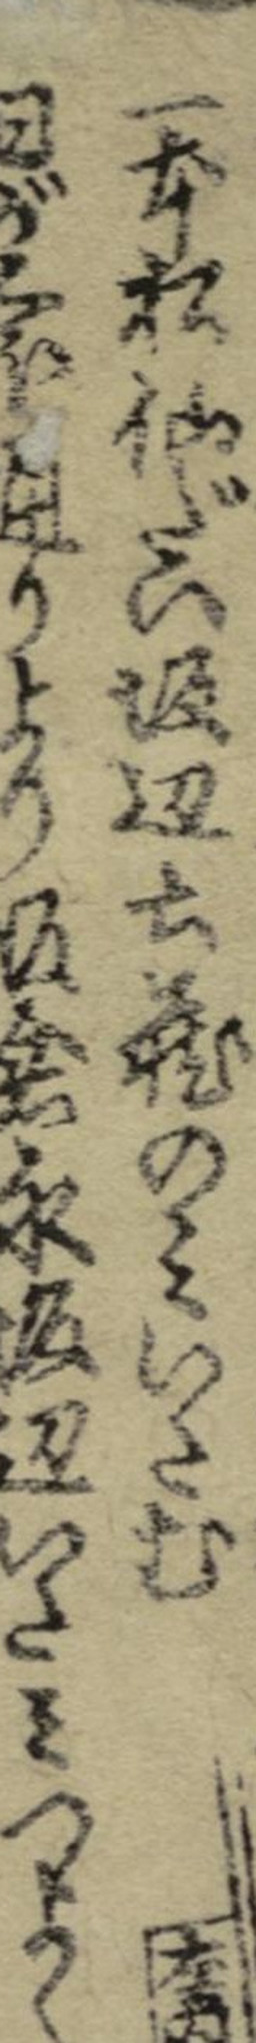日がくほ通りより飯倉永坂辺いたみつよく
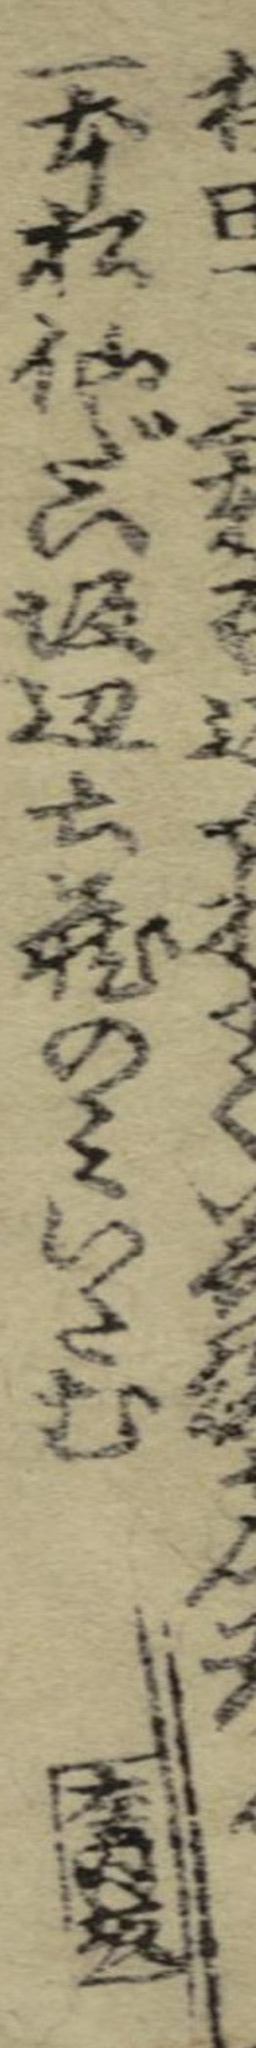一本松仙だい坂辺土蔵のみいたむ
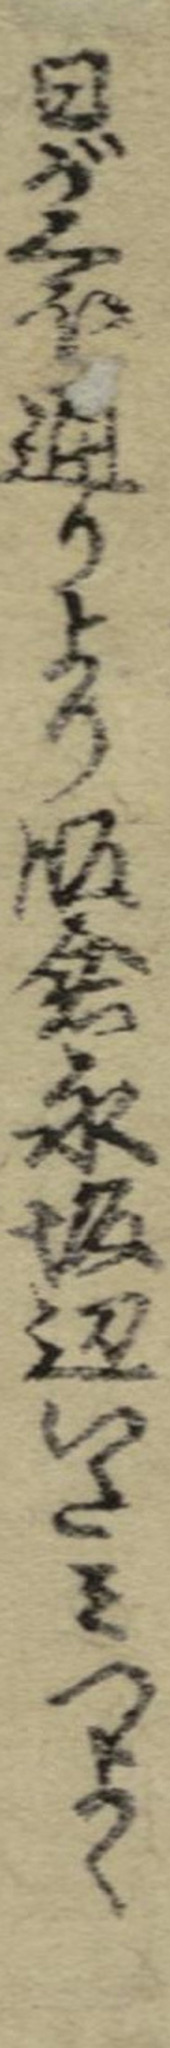日がくほ通りより飯倉永坂辺いたみつよく
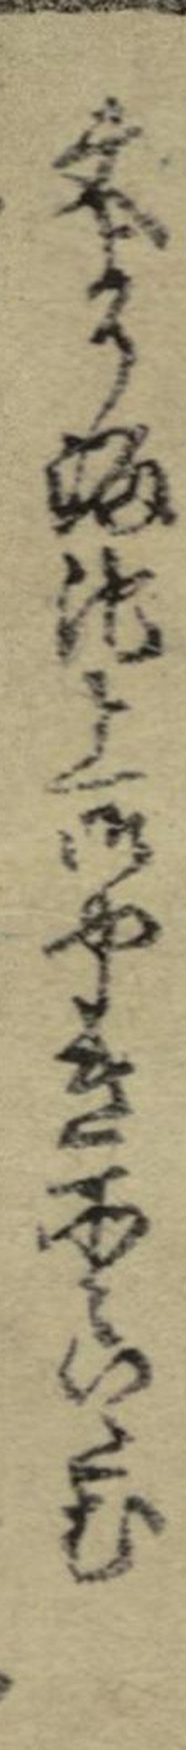夫より溜池上御やしき所々いたむ
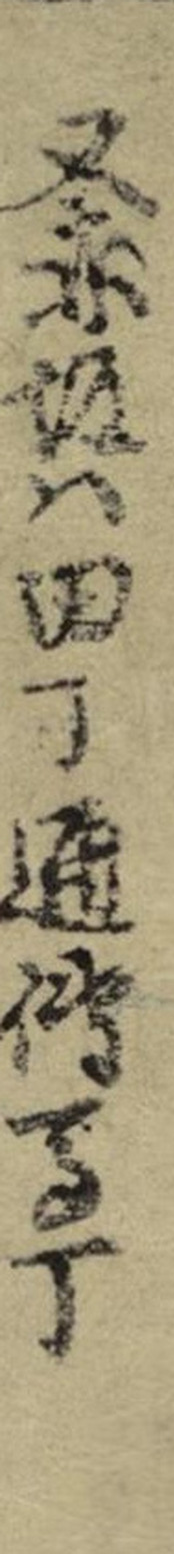又赤坂は田丁通伝馬丁
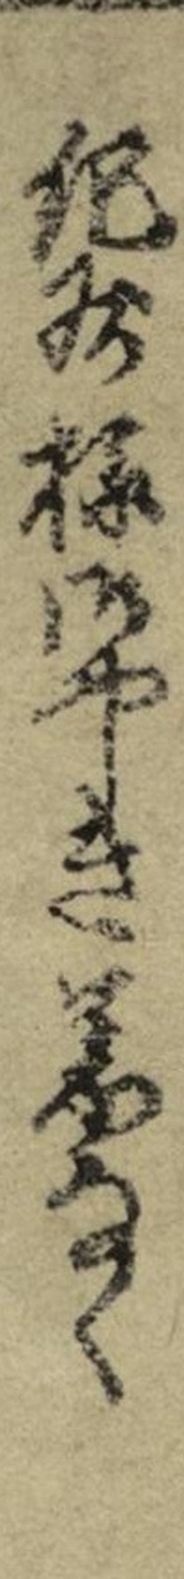紀州様御やしき恙なく
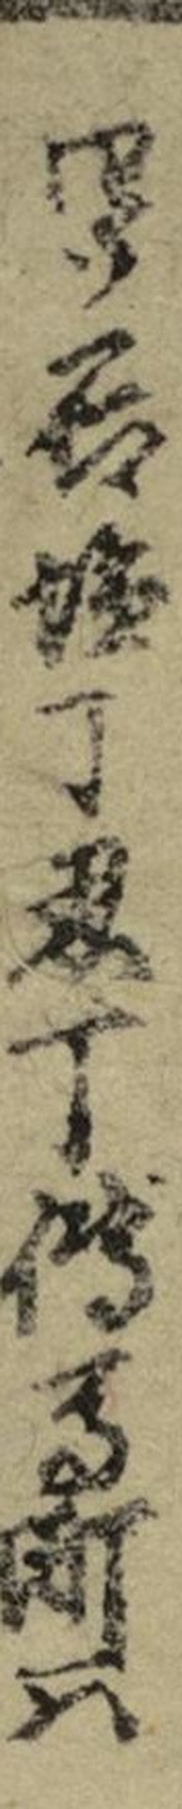四ツ谷堀丁忍丁伝馬町は
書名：安政二年十月二日大地震并出火場所方角巨細
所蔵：東京大学地震研究所図書室 Earthquake Research Institute Library, The University of Tokyo, JAPAN
